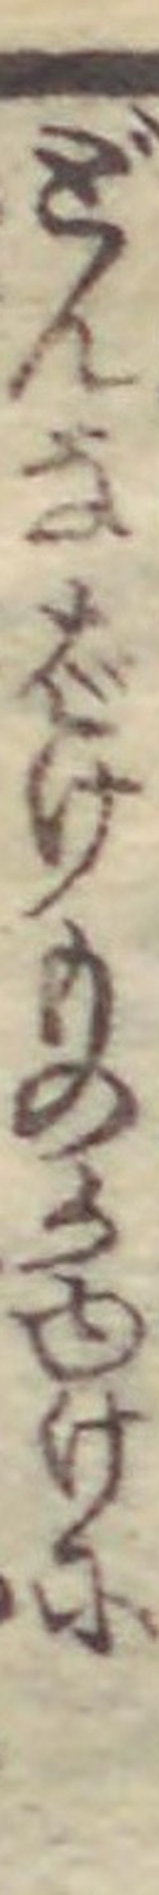どんなばけものかゆけに
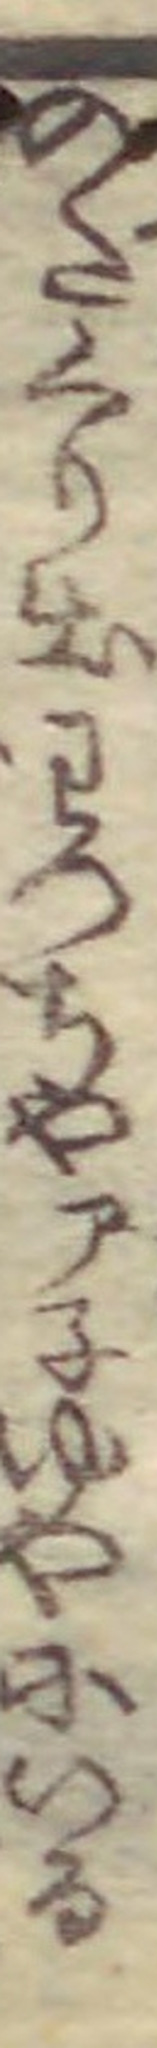のたくり出わつちやァ子ゆやにいる
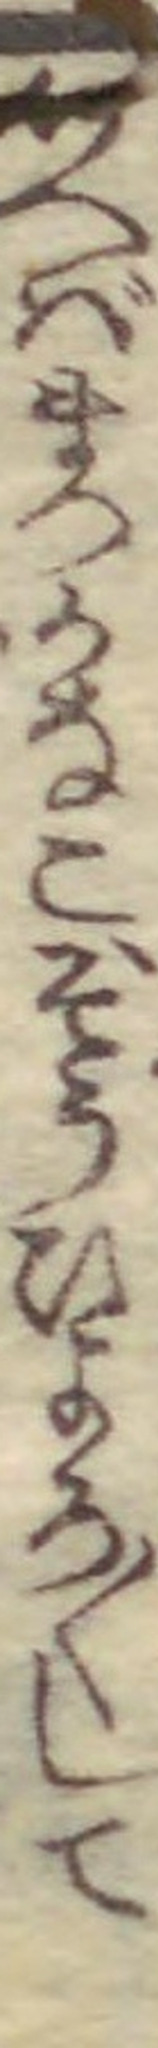いへばまつかなこぞうひよろ〳〵して
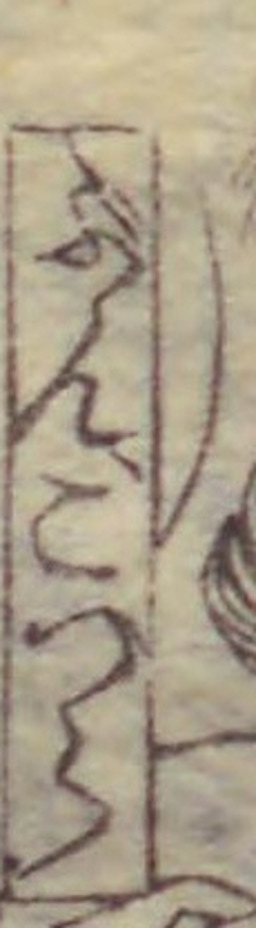ぶんごつら
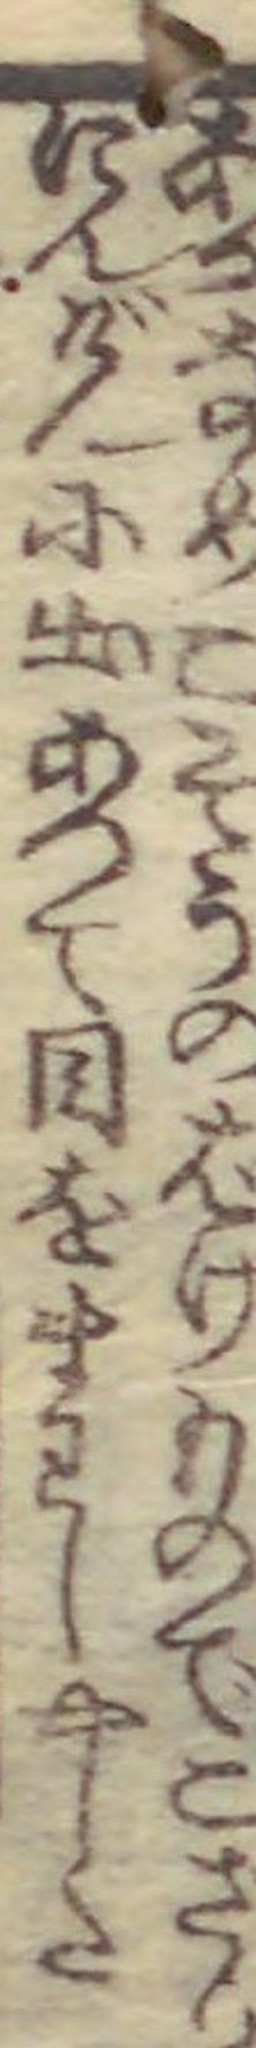にんげんに出あつて目をまわしやした
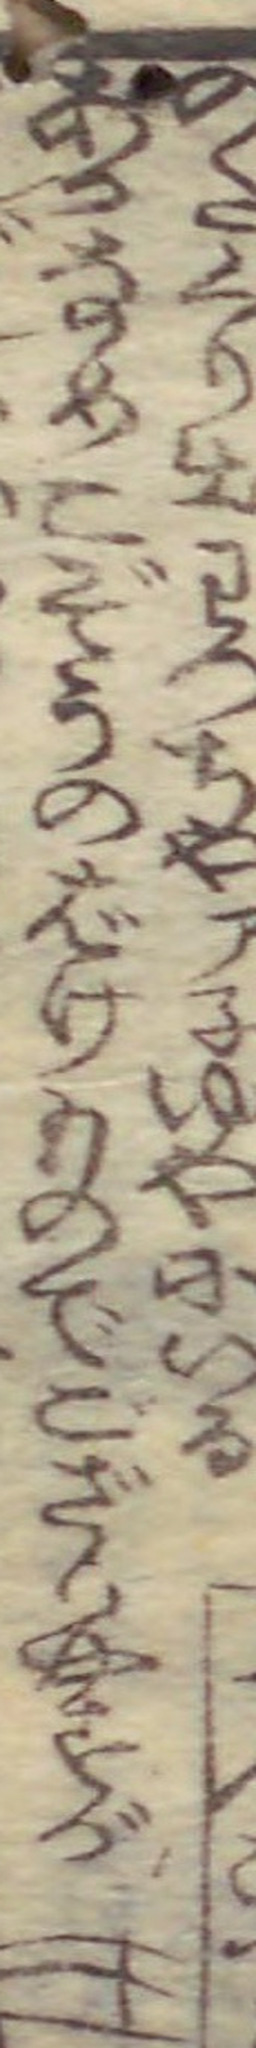あかなめこぞうのばけものでござりやすが
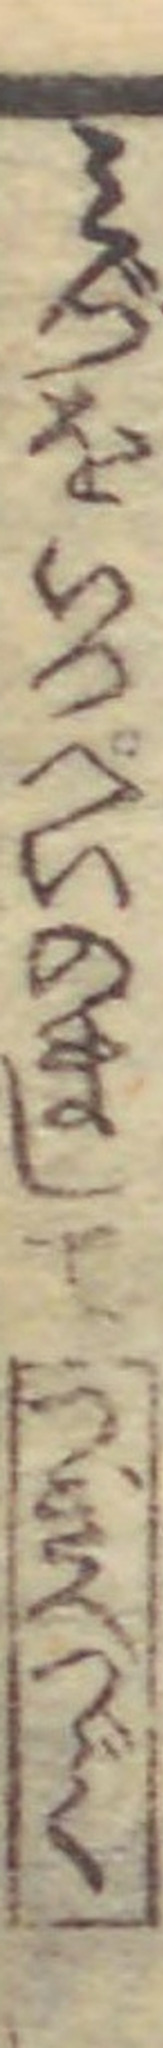みづをいつぺいのましてつぎへつゞく

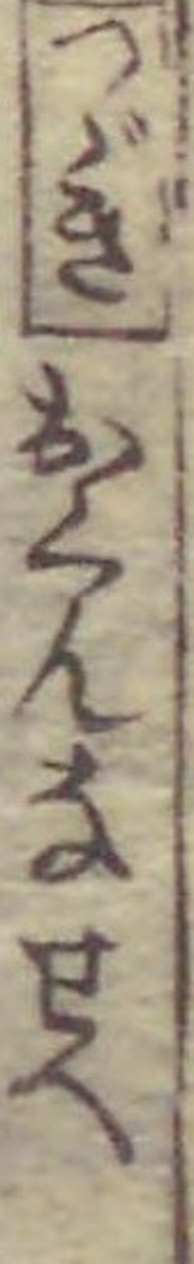つゞきおくんなせへ
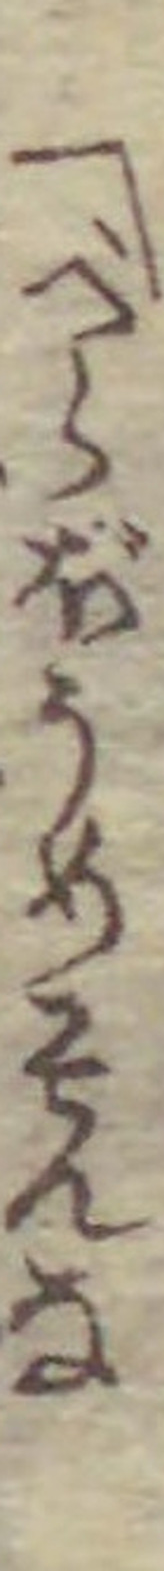〽べらぼうめそんな
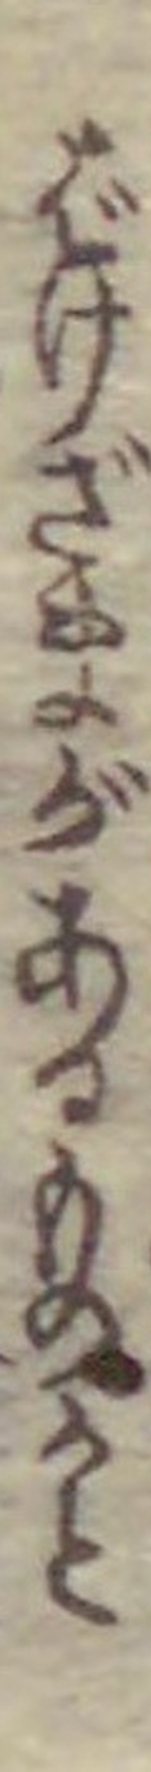ばけざまがあるものかと
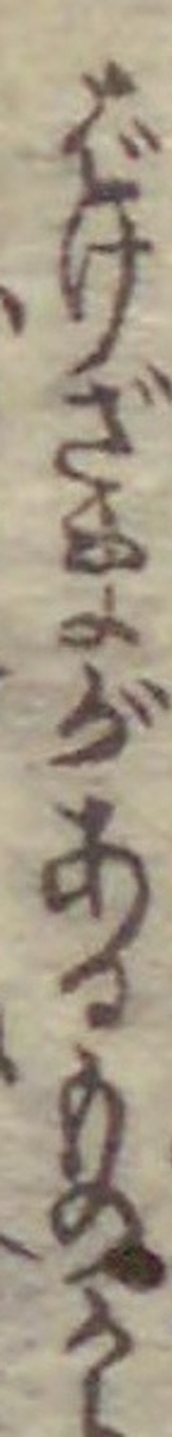ばけざまがあるものかと
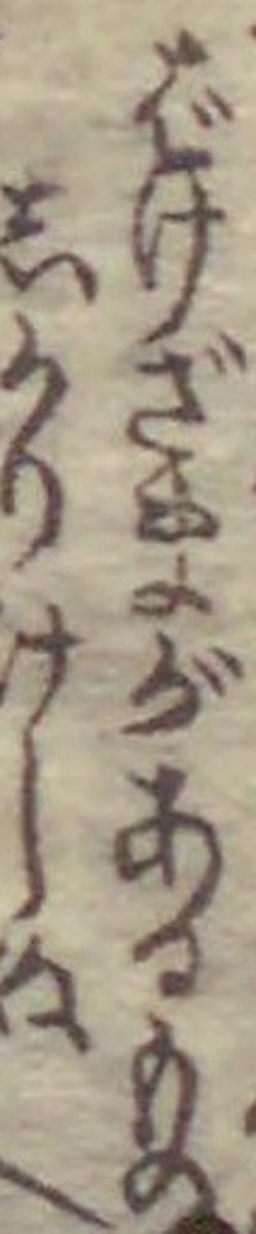しかりけしぬ
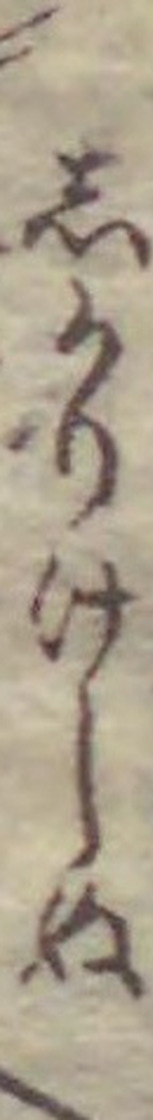しかりけしぬ

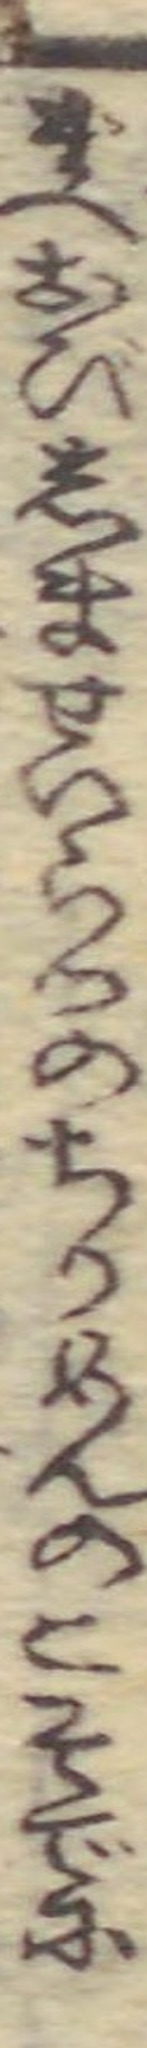まへおびしませいらつのちりめんのこそでに
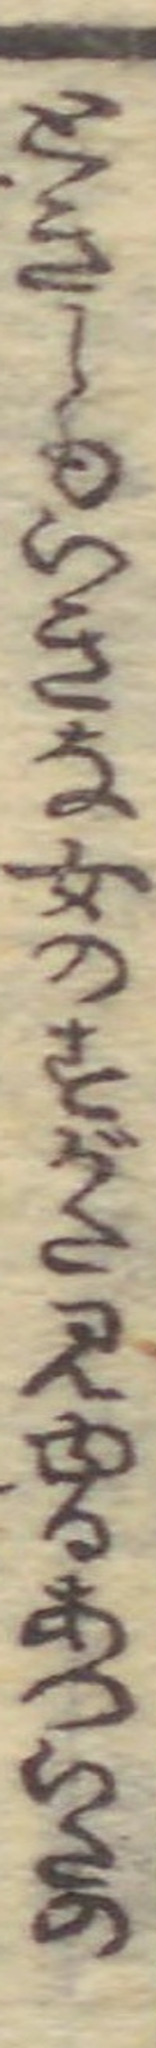ときしもいきな女のすがた見ゆるあついたの
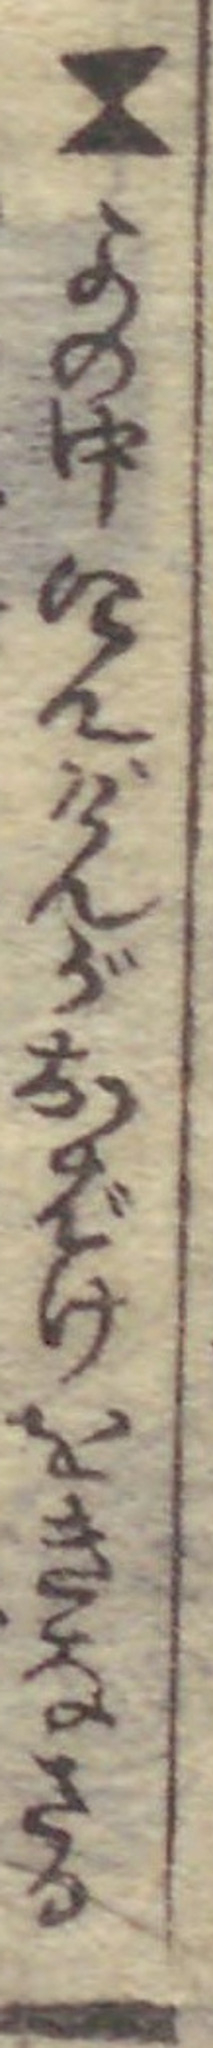▼▲よの中にんげんがおばけをきなさる
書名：大時代唐土化物 3巻. 曽我太夫染
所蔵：国立国会図書館 National Diet Library, JAPAN
